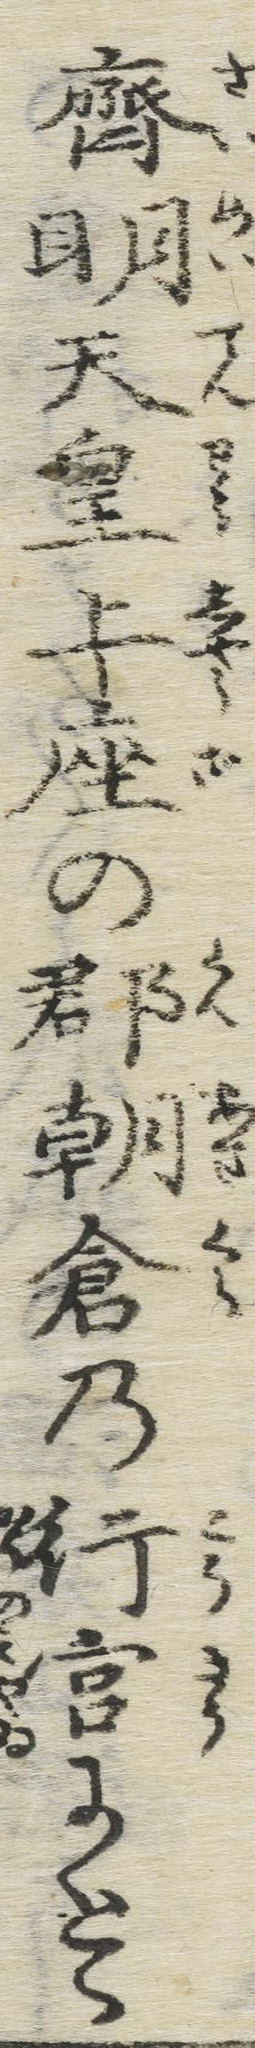斉明天皇上座の郡朝倉の行宮にとゝ
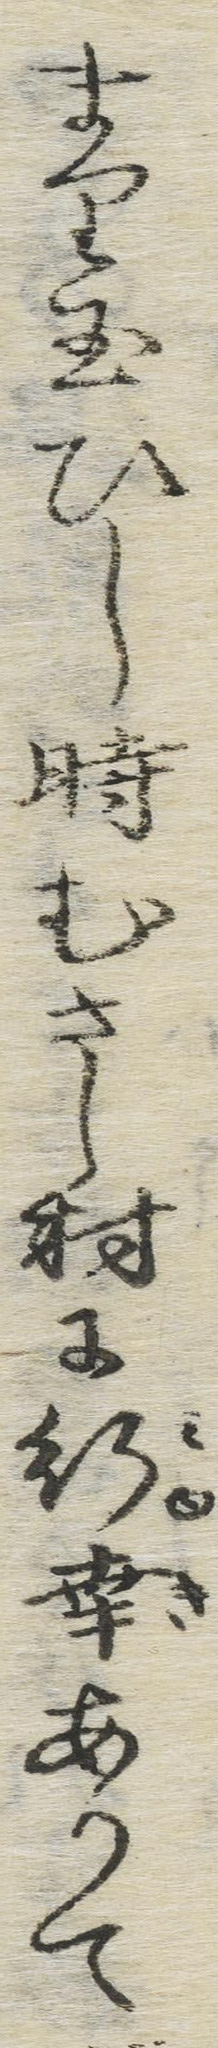まり玉ひし時むさし村に行幸ありて
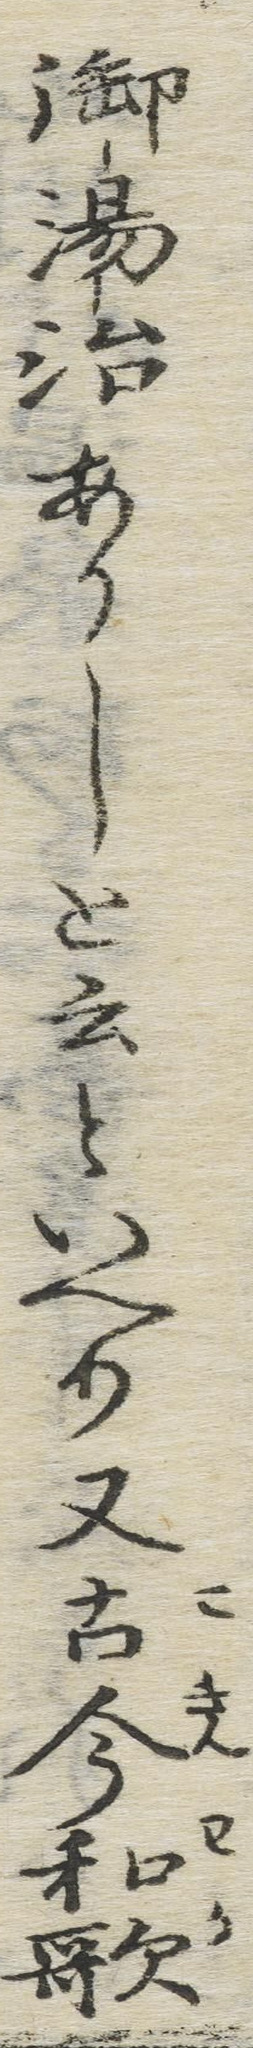御湯治ありしと云といへり又古今和歌
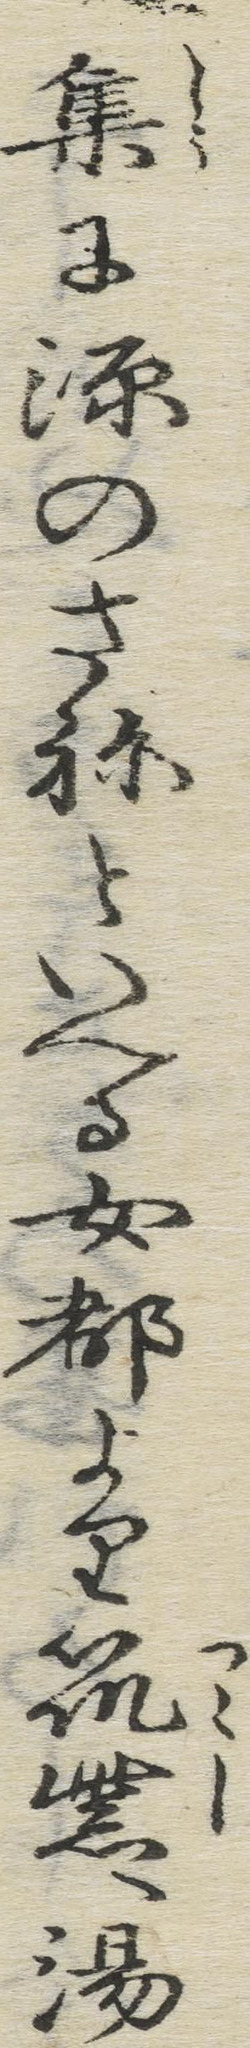集に源のさねといへる女都より筑紫へ湯
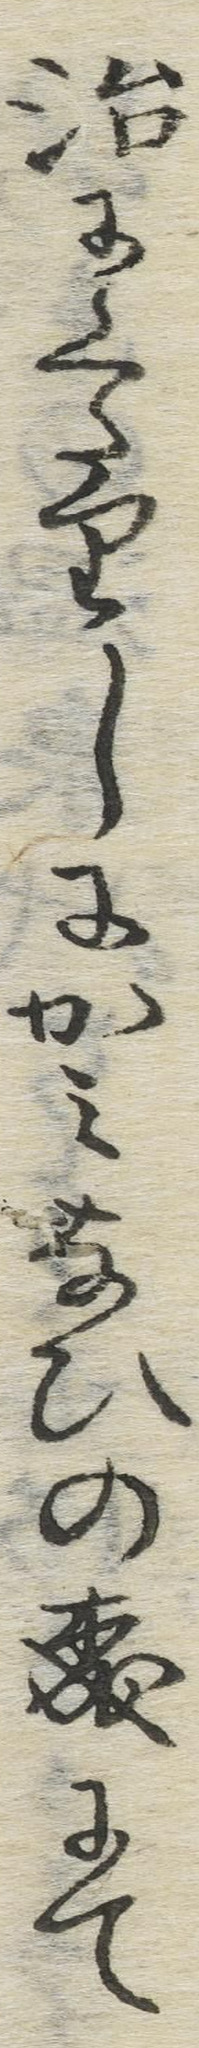治にくたりしにかみなひの夢にて
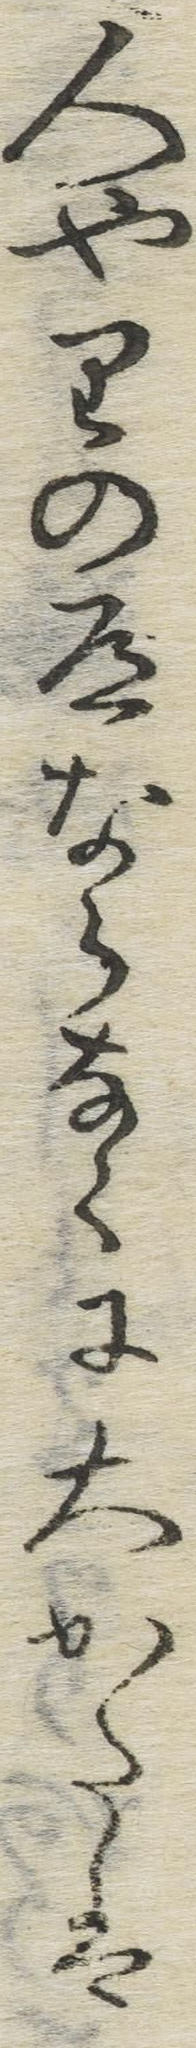人やりのやならなくに大かたは
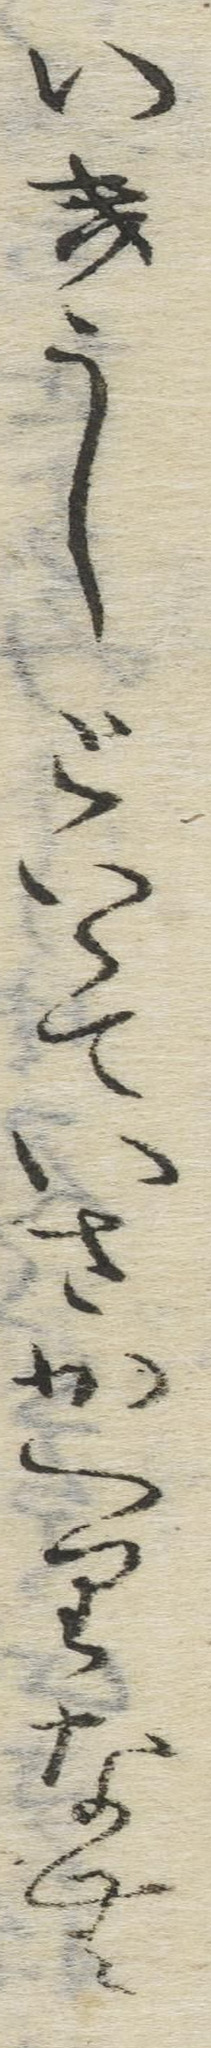いきこしといゝていさかへりなむ

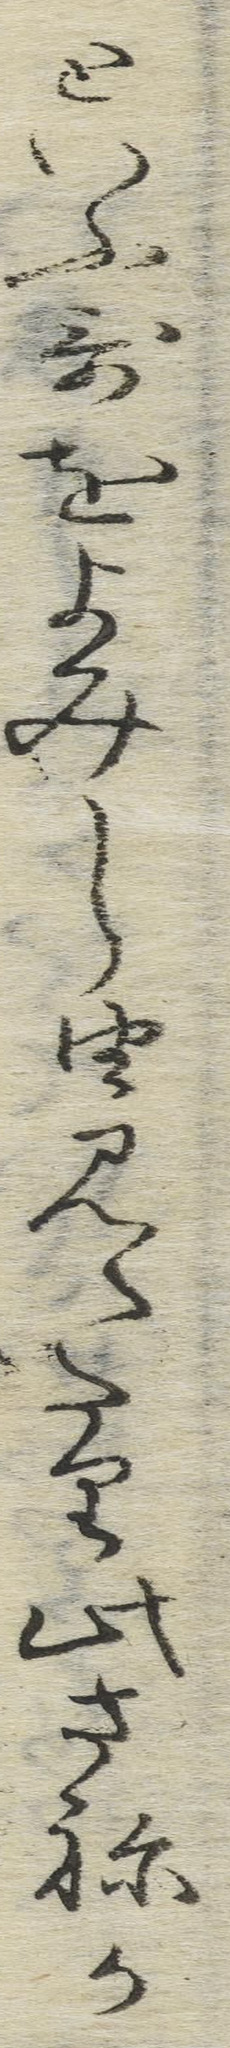といふ歌をよみし由見へたり此さねか
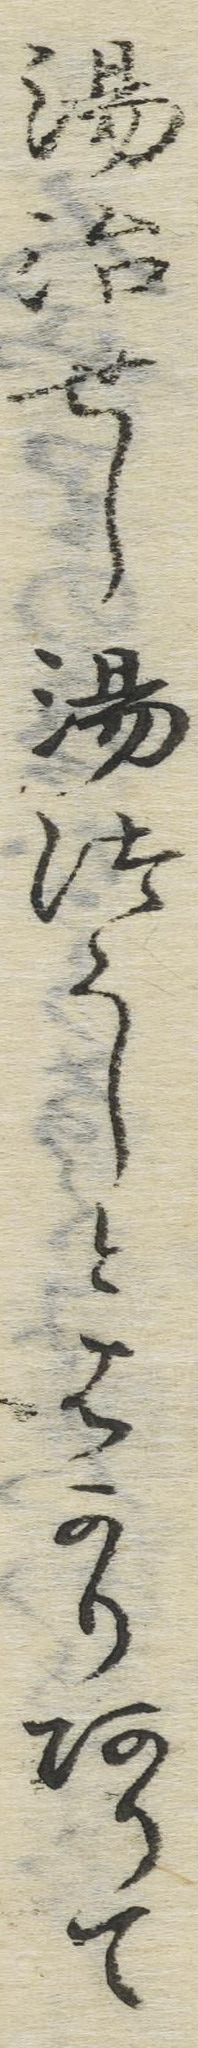湯治せし湯つくしとはかりありて
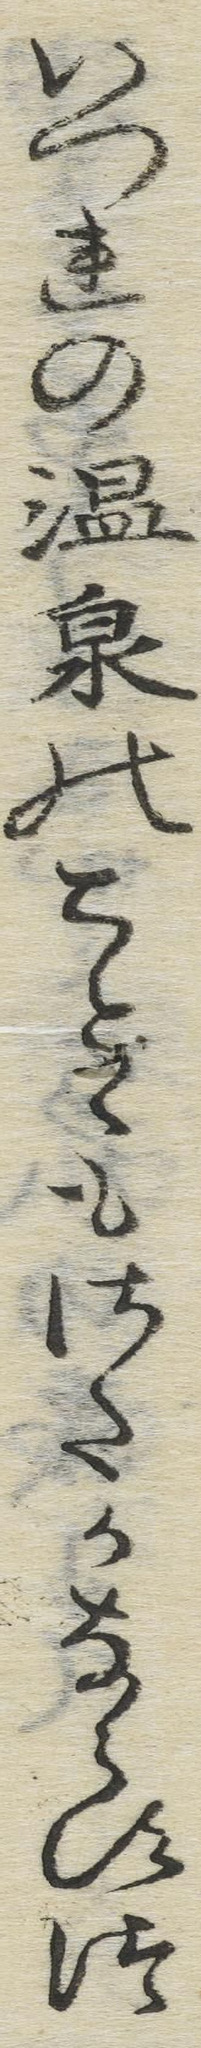いつれの温泉のことゝもさたかならすつ
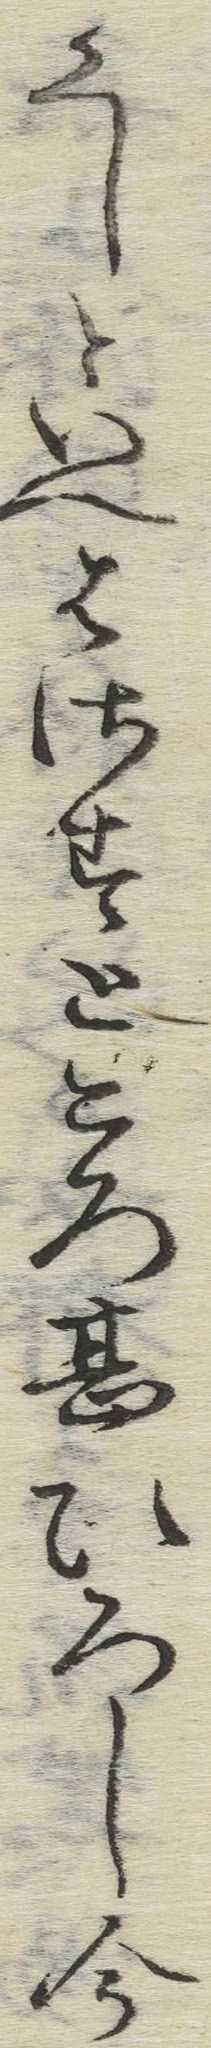くしといへはさすところ甚ひろし今
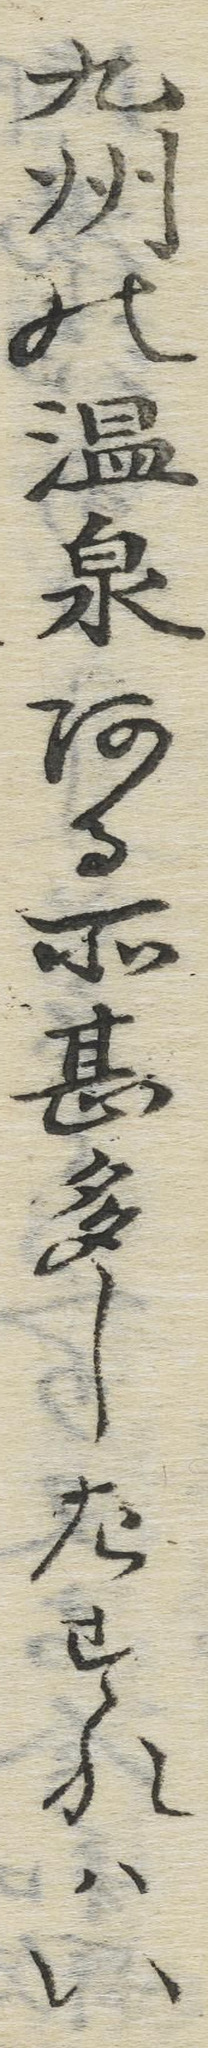九州の温泉ある所甚多し左さすれはい
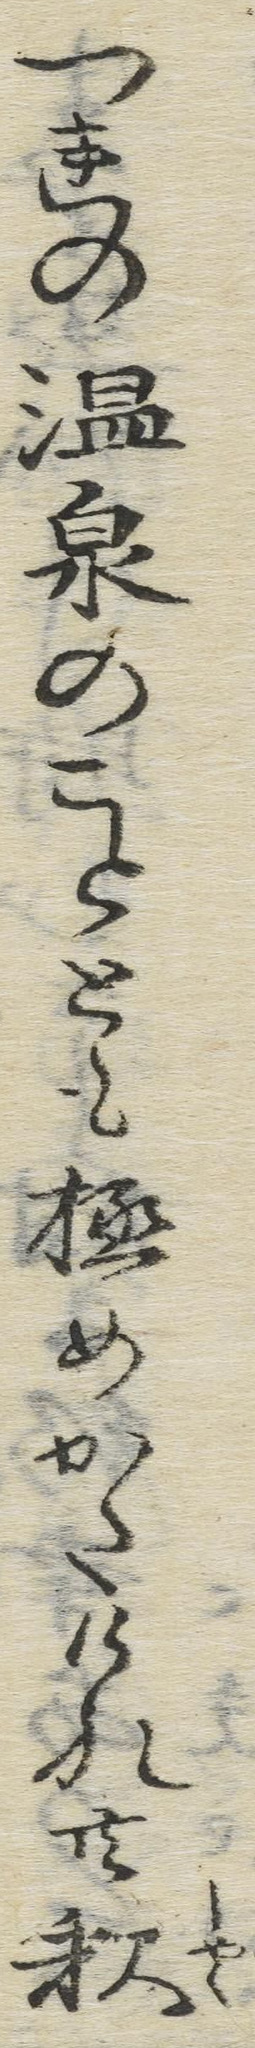つれの温泉のこととも極めかたけれ共釈
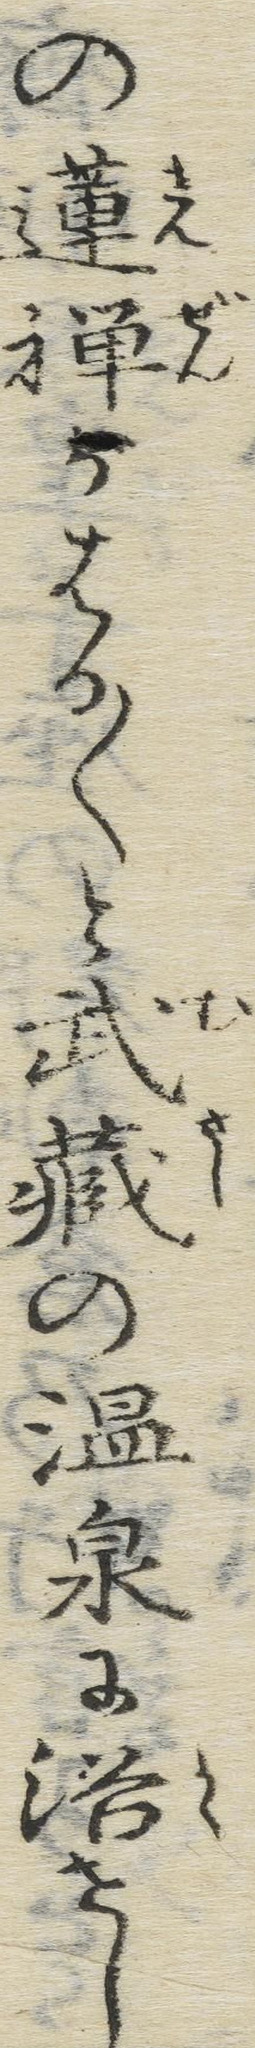の蓮禅かはる〳〵と武蔵の温泉に浴せし
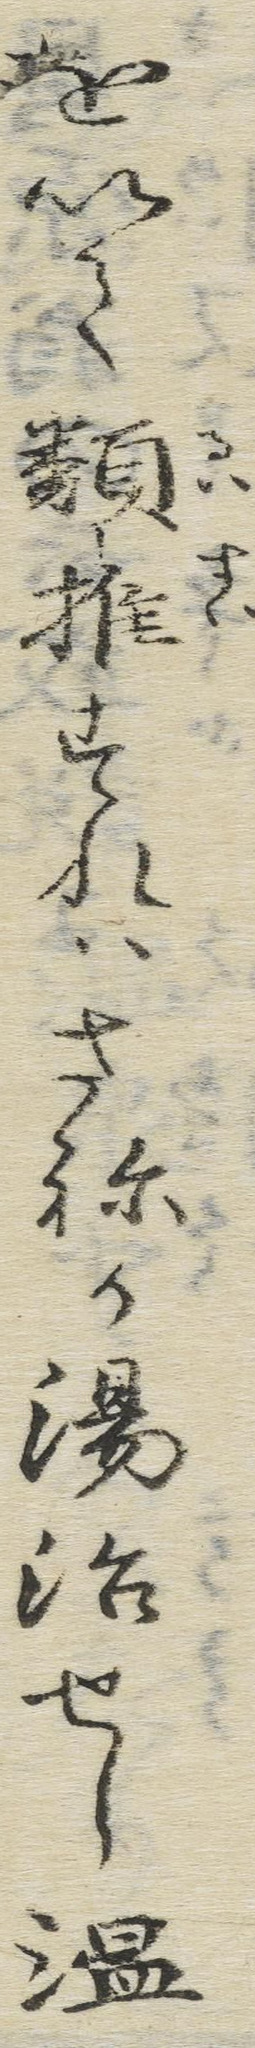を以て類推すれはさねか湯治せし温
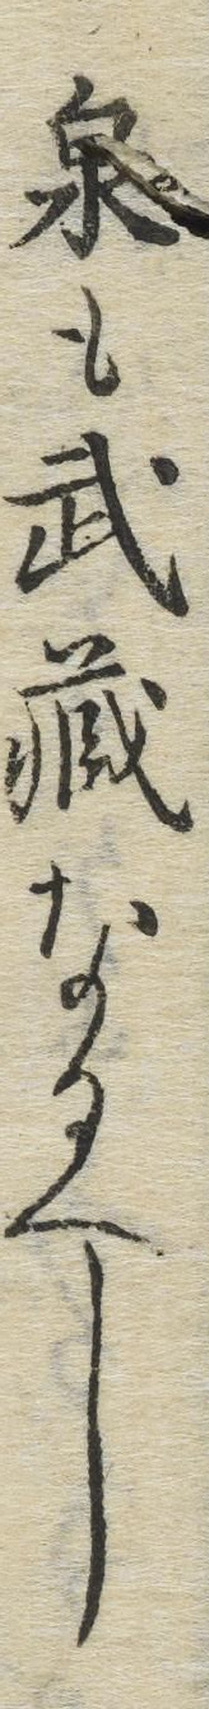泉も武蔵なるへし
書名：温泉考
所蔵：東京大学地震研究所図書室 Earthquake Research Institute Library, The University of Tokyo, JAPAN
